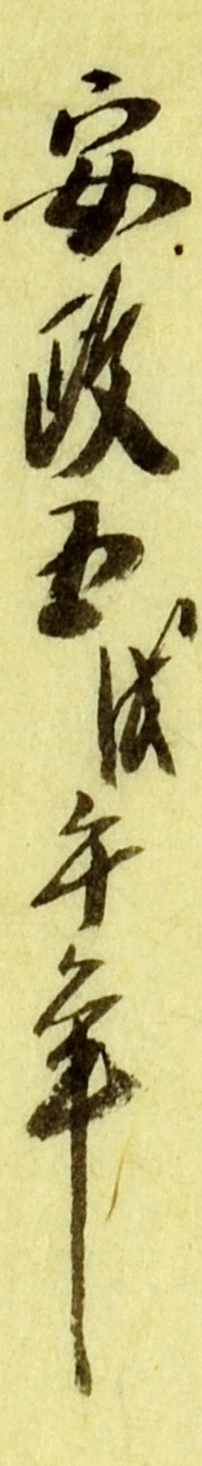安政五戊午年
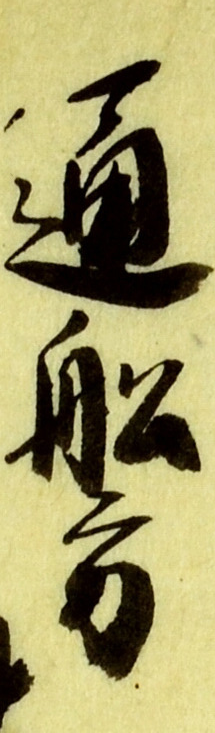通船方
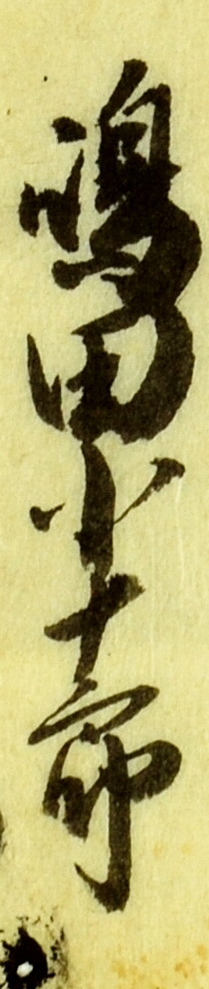嶋田小十郎
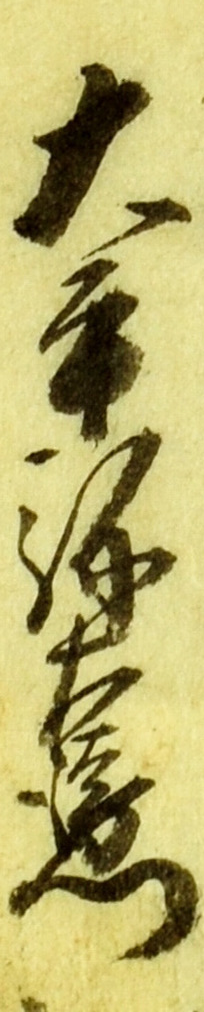大平弥右衛門
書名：通船方植付方御手傳金證文控
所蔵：伊那市立高遠町図書館・合同会社AMANE
